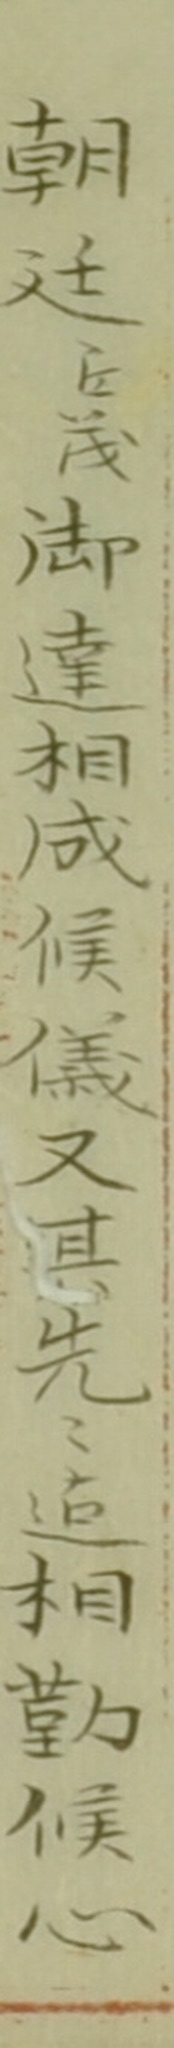朝廷江茂御達相成候儀又其先々迄相勤候心
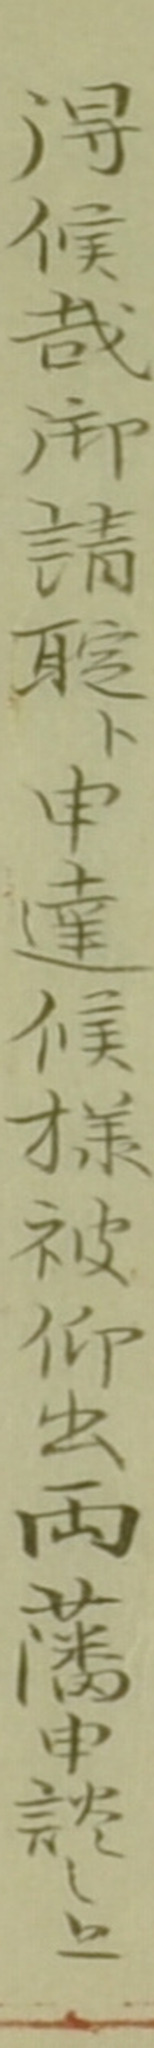得候哉御請聢ト申達候様被仰出両藩申談之上
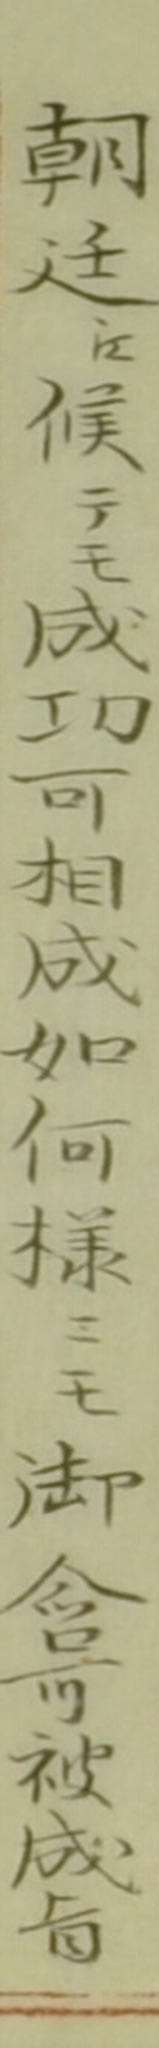朝廷江候テモ成功可相成如何様ニモ御含可被成旨
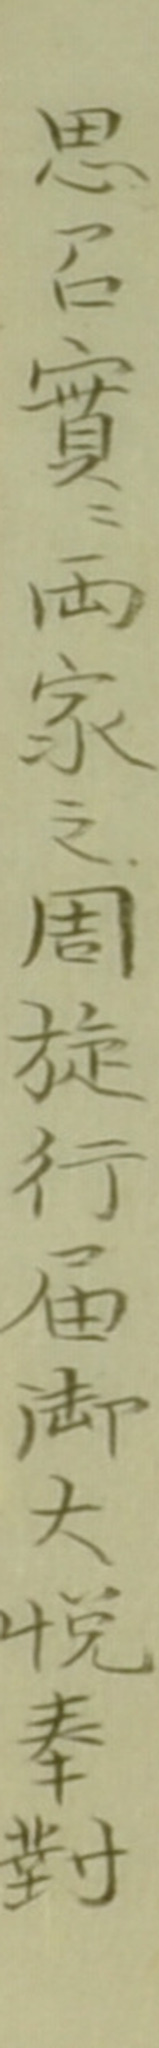思召実ニ両家之周旋行届御大悦奉対
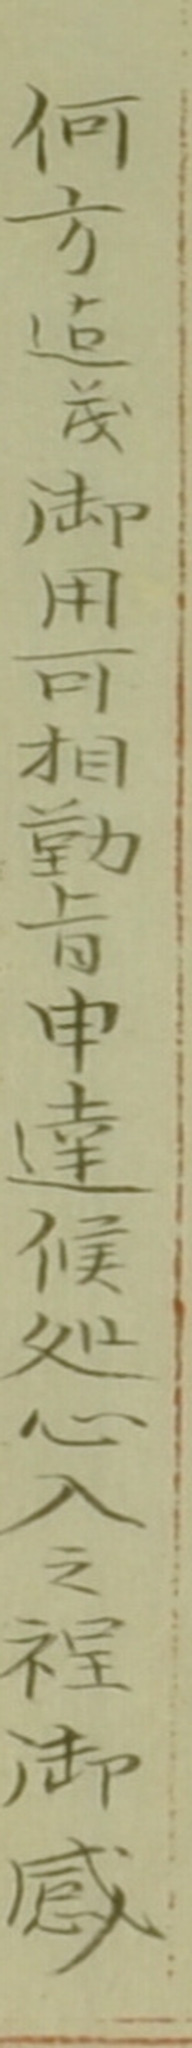何方迄茂御用可相勤旨申達候処心入之程御感
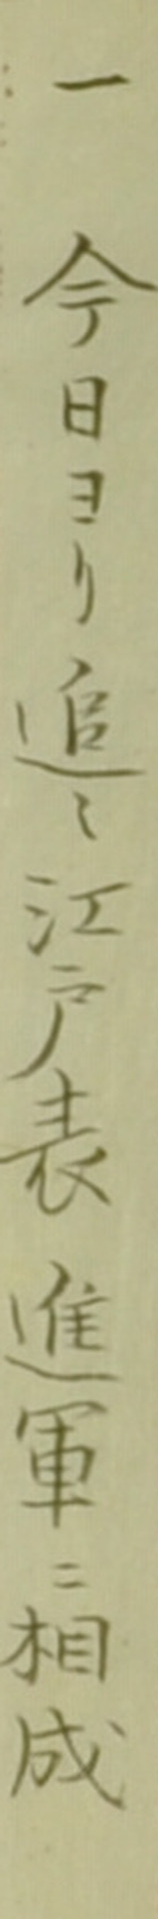一今日ヨリ追々江戸表進軍ニ相成
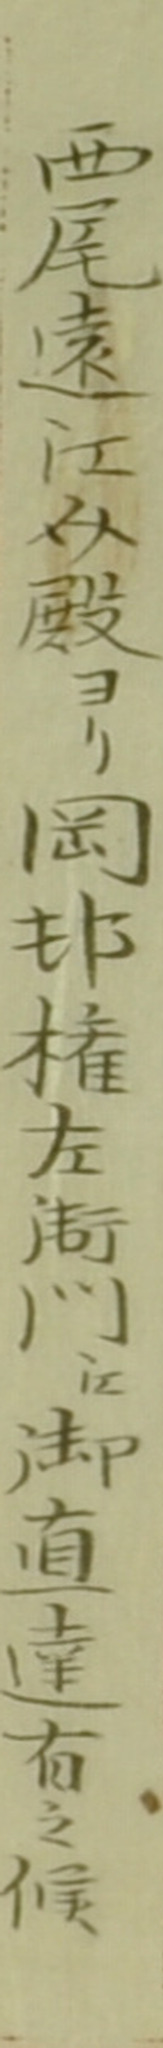西尾遠江介殿ヨリ岡部権左衛門江御直達有之候

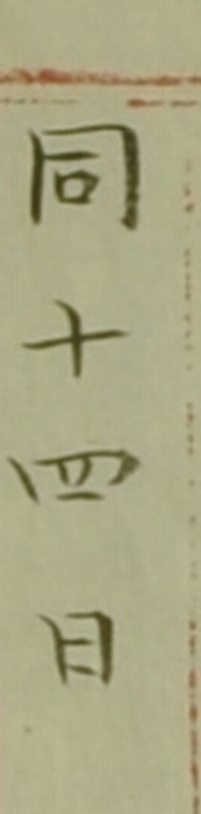同十四日
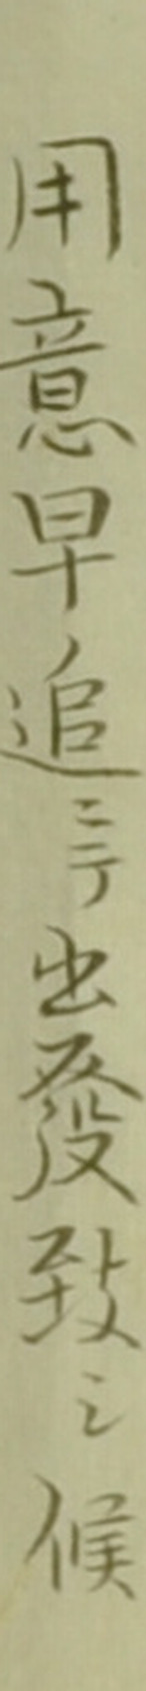用意早追ニテ出發致シ候
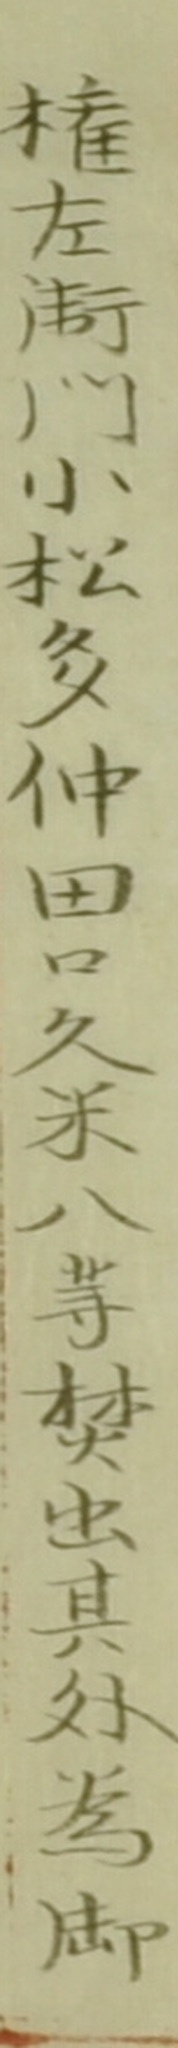権左衛門小松多仲田口久米八等焚出其外為御
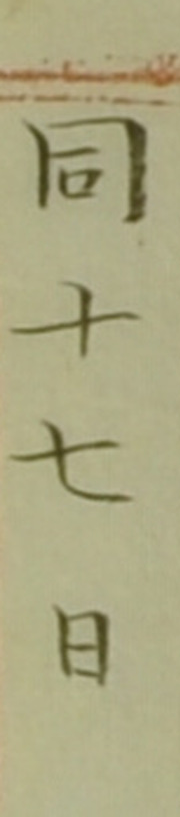同十七日
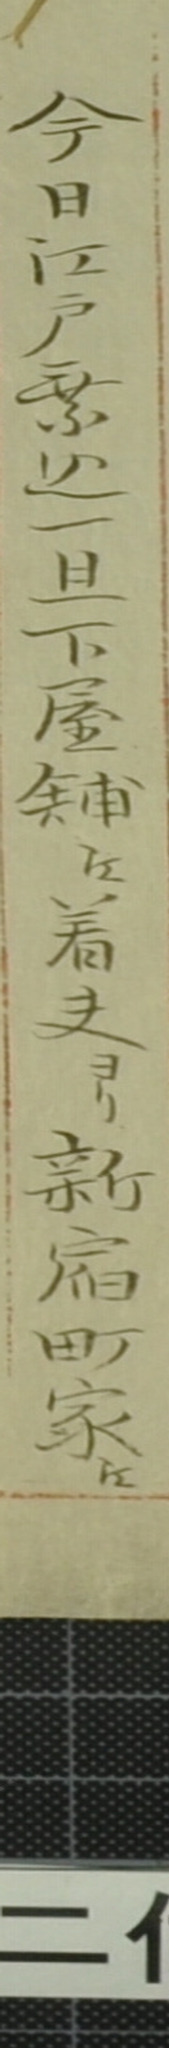一今日江戸乘辺一旦下屋舗江着夫ヨリ新宿町家江
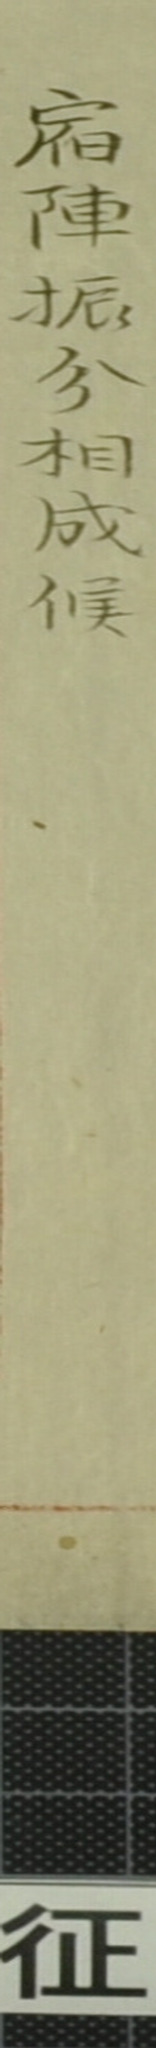宿陣振分相成候
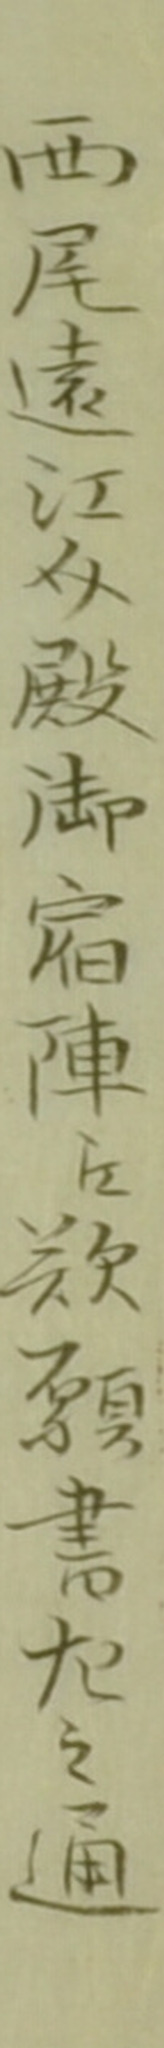一西尾遠江介殿御宿陣江嘆願書左之通
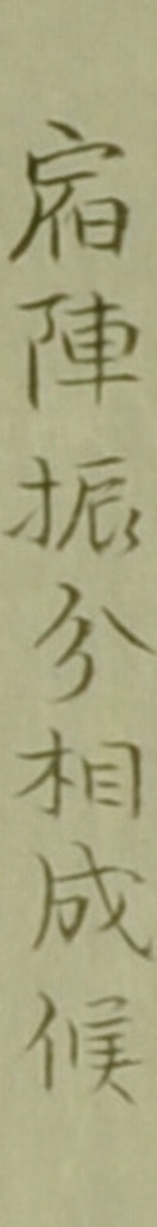宿陣振分相成候
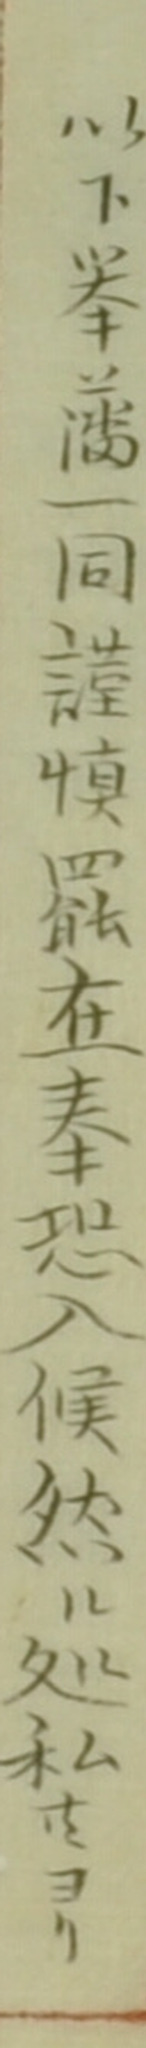以下挙藩一同謹慎罷在奉恐入候然ル処私共ヨリ
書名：御東征ニ付甲州口兵食人馬御賄之事件（控）
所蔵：伊那市立高遠町図書館・合同会社AMANE
